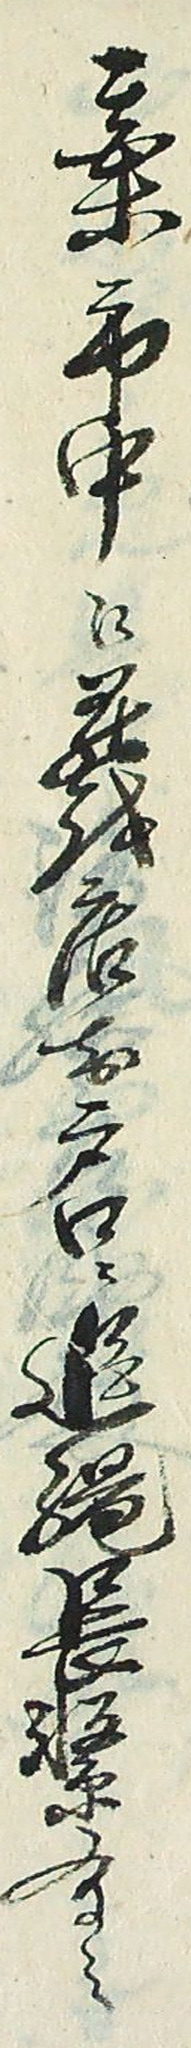乗市中江罷越店前戸口に追縄長繋有之
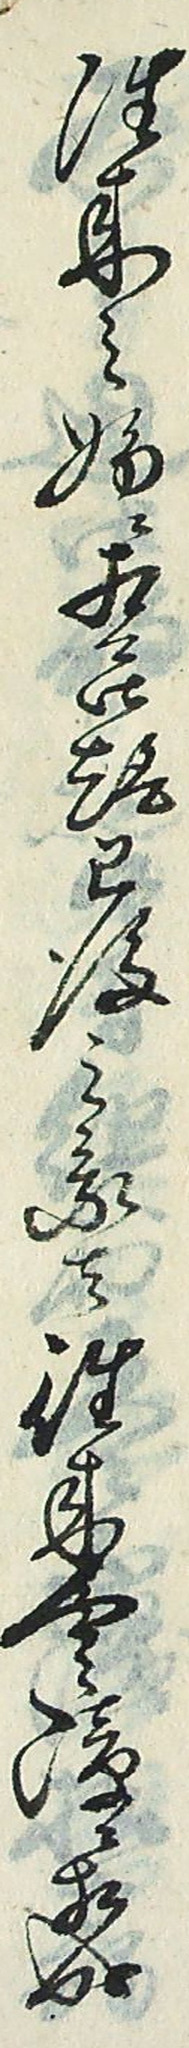往来之妨に相当趣已後之義者往来之障に相成
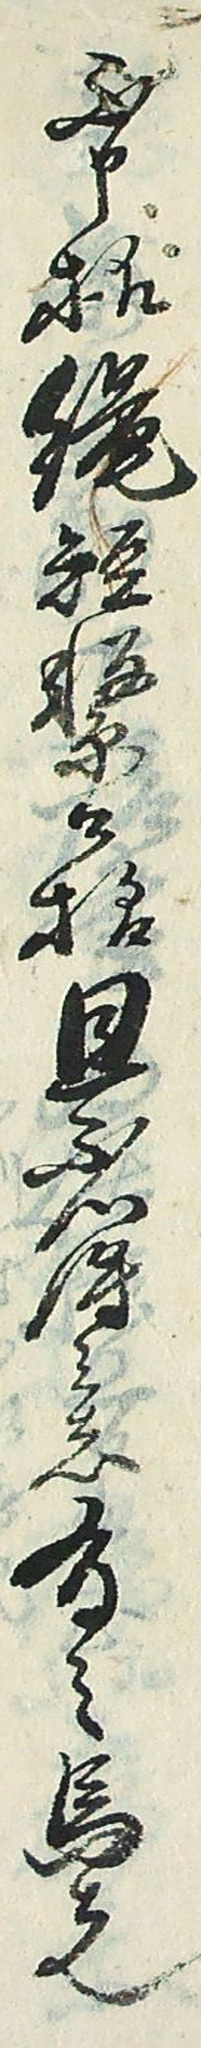不申様縄短繋候様且不心得之者有之馬先
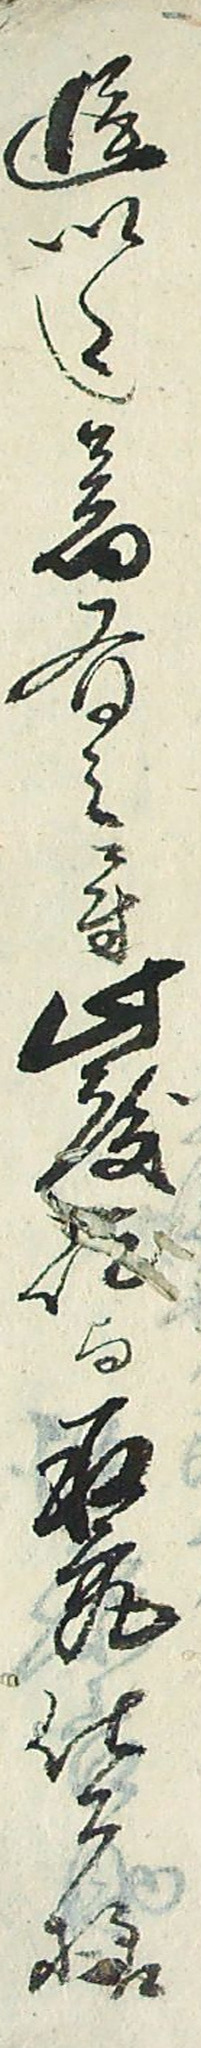追いたし候者有之に付此度屹と取究仕候様

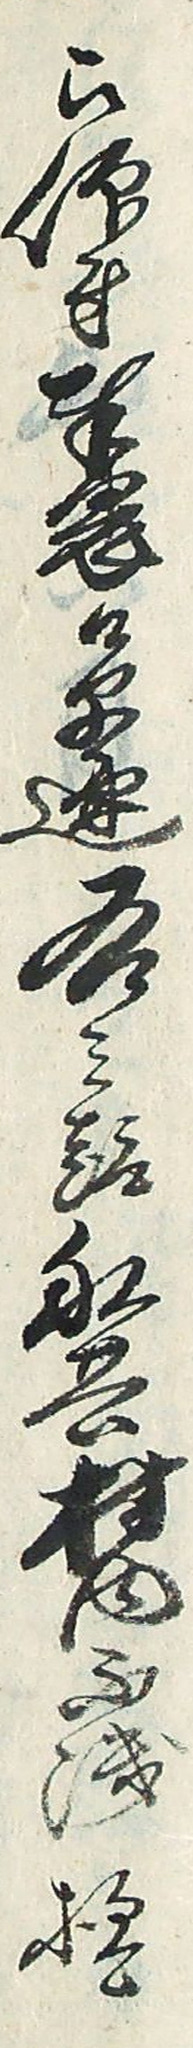被仰付奉畏候早速右之趣私共村内不洩様
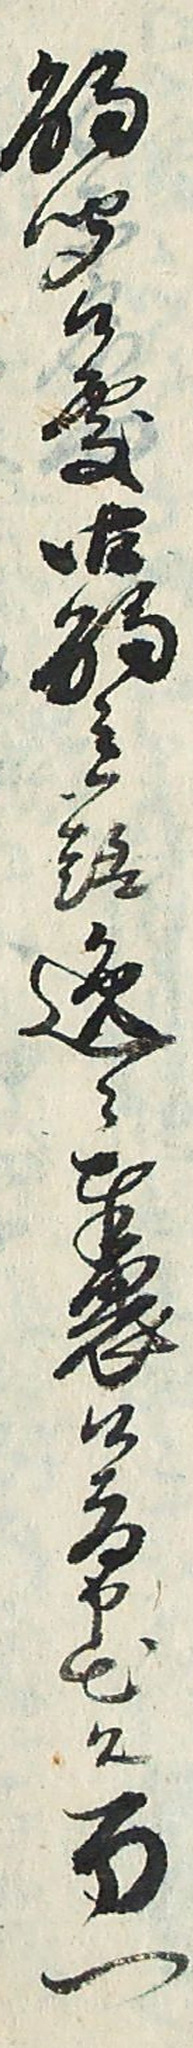触聞候處御触之御趣逸々奉畏候旨申出候万一
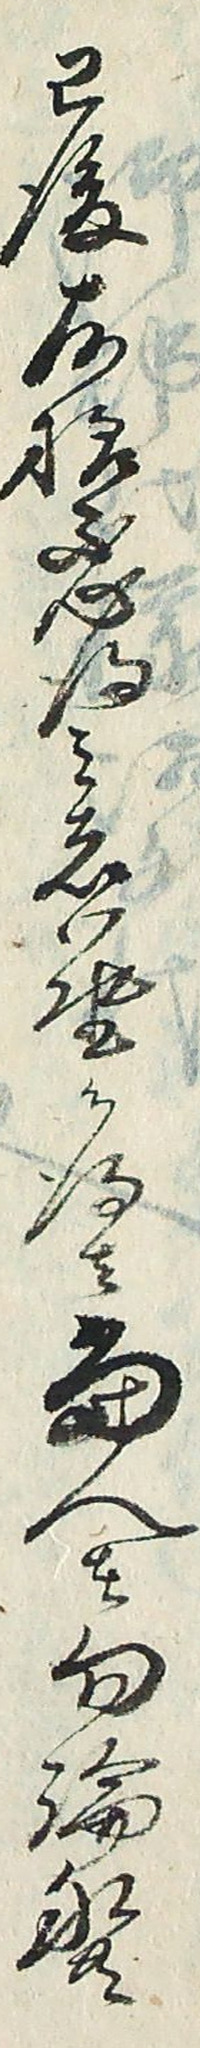已後左様不心得之者御坐候得者当人者勿論私共
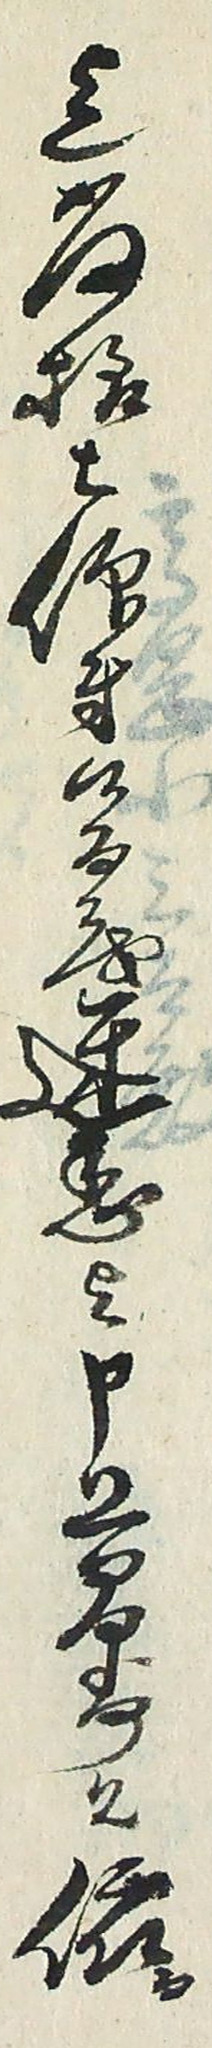迄如何様被仰付候而も迷惑と申上間布候依而
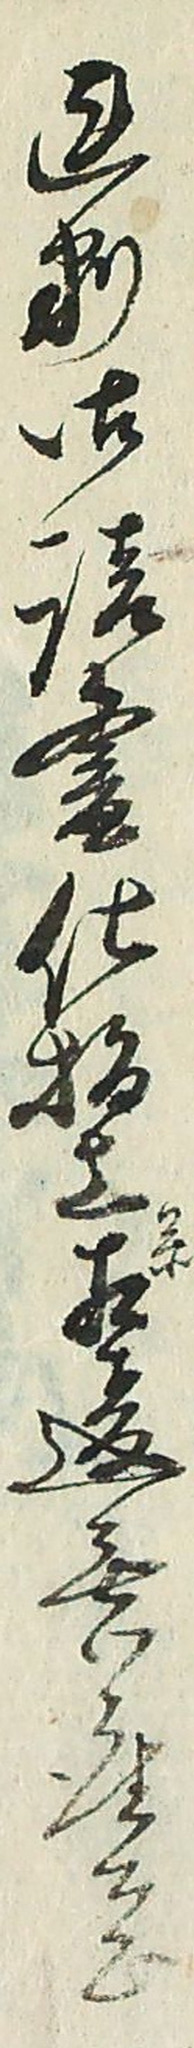連判御請書仕指上候所相違無御座候以上
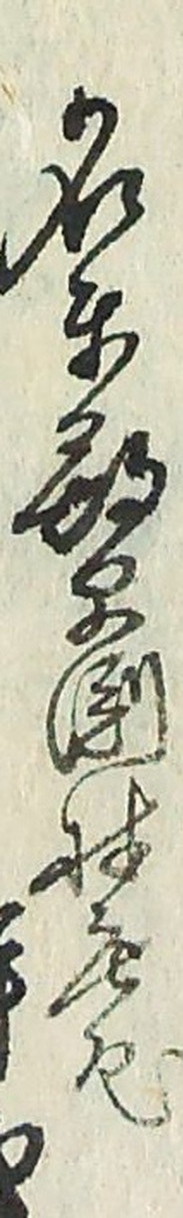名東郡早渕村庄屋
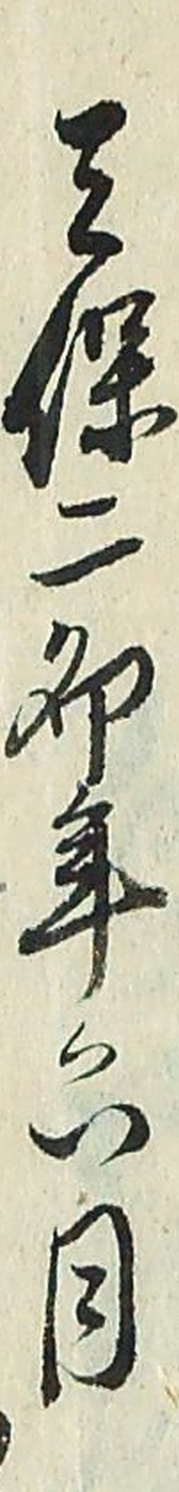天保二卯年六月
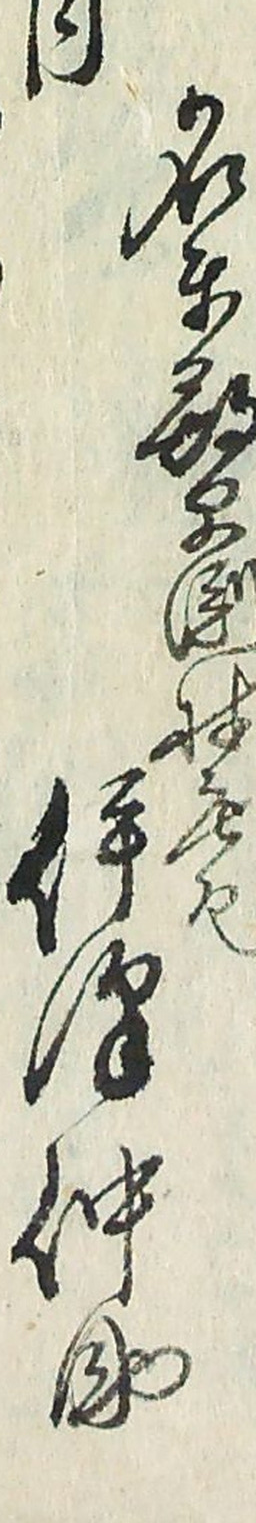伊澤仲助
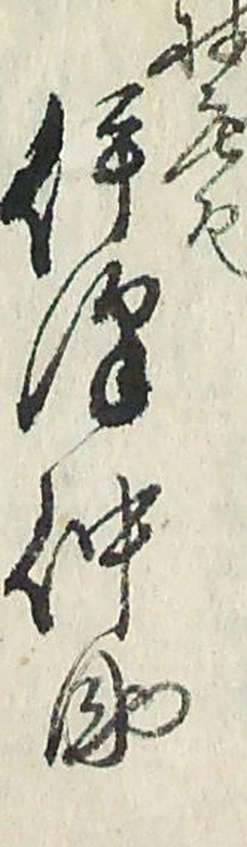伊澤仲助
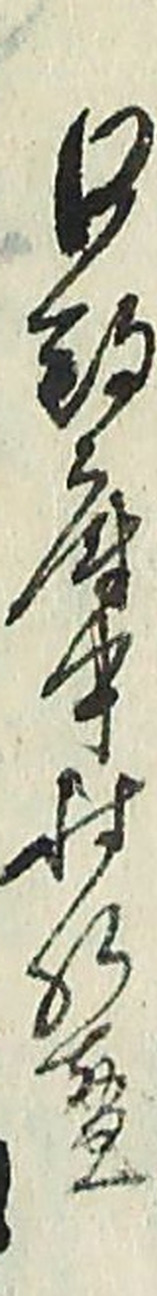同郡府中村肝煎
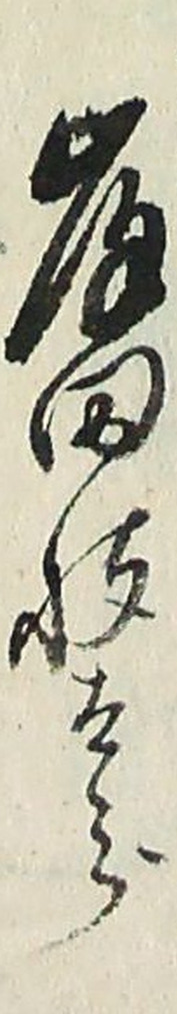岸田快吉郎
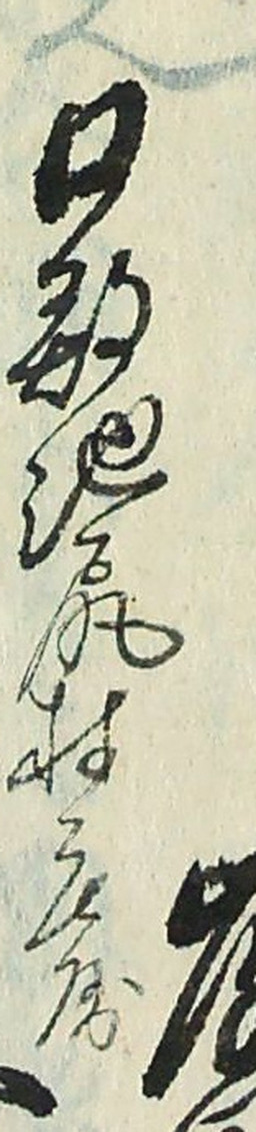同郡池尻村庄屋
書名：諸御用御□受書控
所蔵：鳴門教育大学 Naruto University of Education
